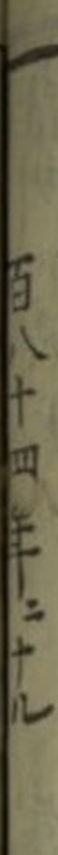百八十四年ニナル
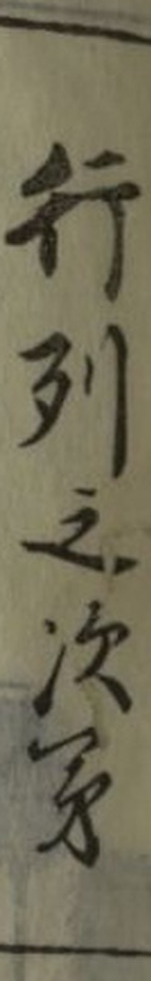行列之次第
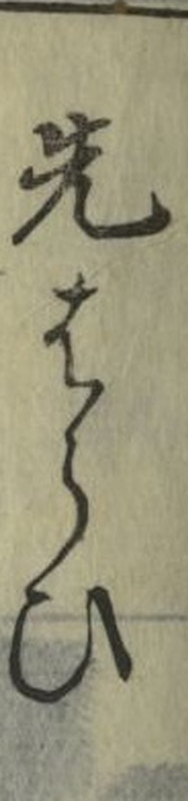先はらひ

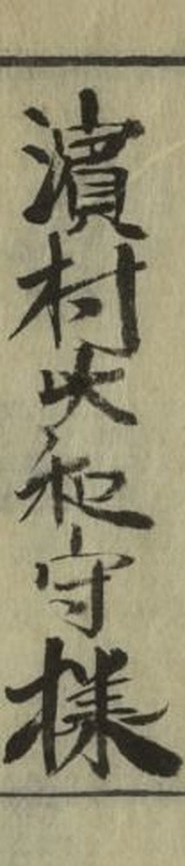濱村大和守様
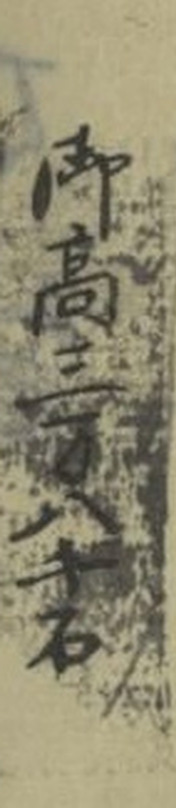御高三万八千石

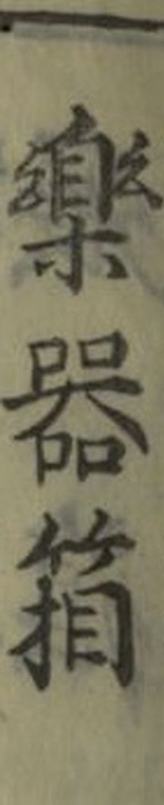樂器箱
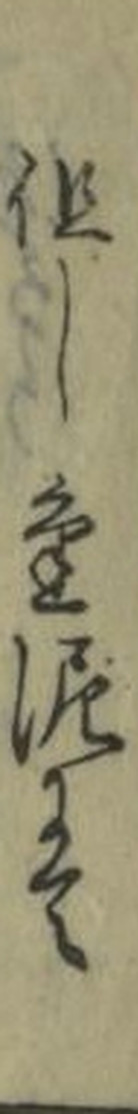但し金泥にて
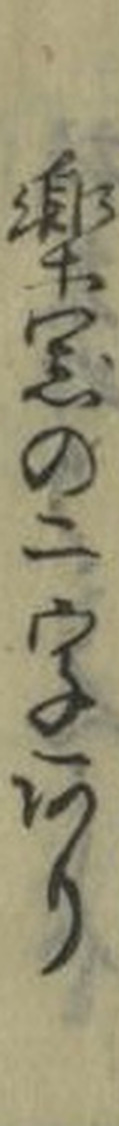樂器の二字あり
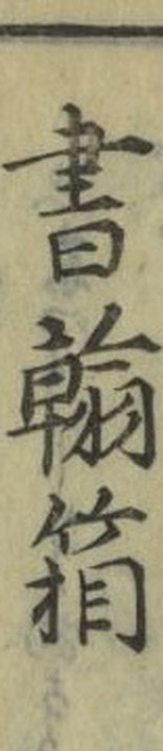書翰箱
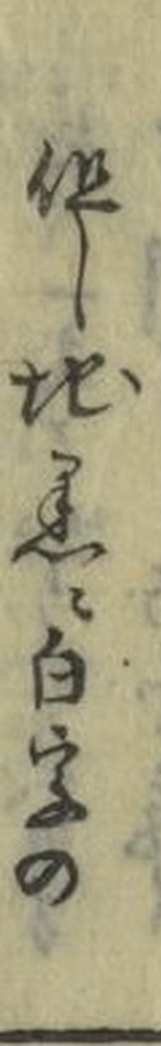但し地黒に白字の
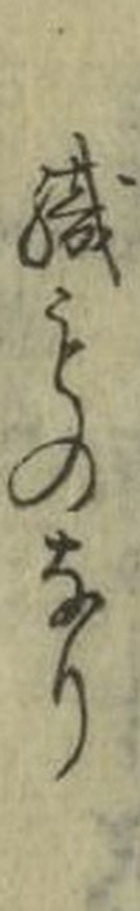織ものなり

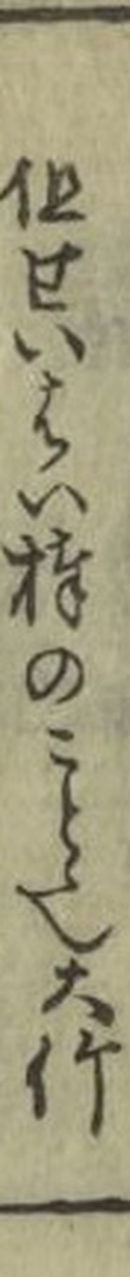但せいはい棒のこと也大竹
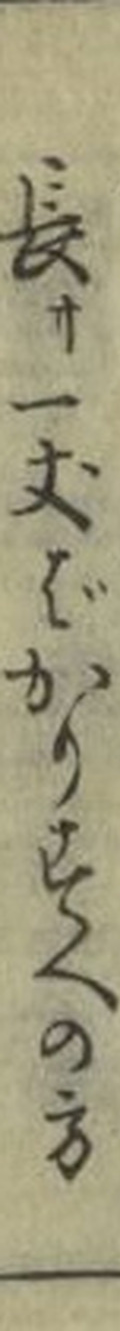長一𠀋ばかりすへの方
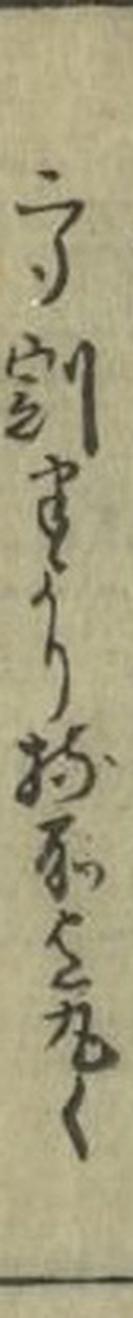二つ割半より持所迄丸く
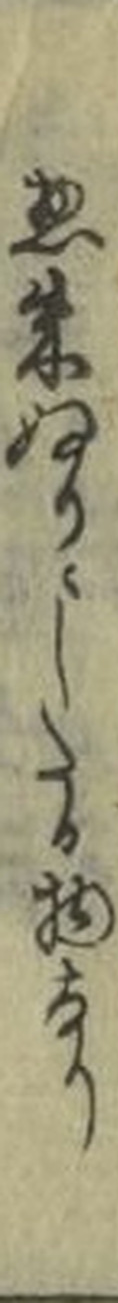惣朱ぬりしたる物なり
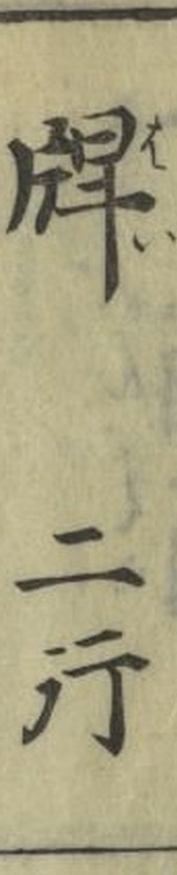牌二行
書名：新板 琉球人行列記
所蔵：University of the Ryukyus Library
